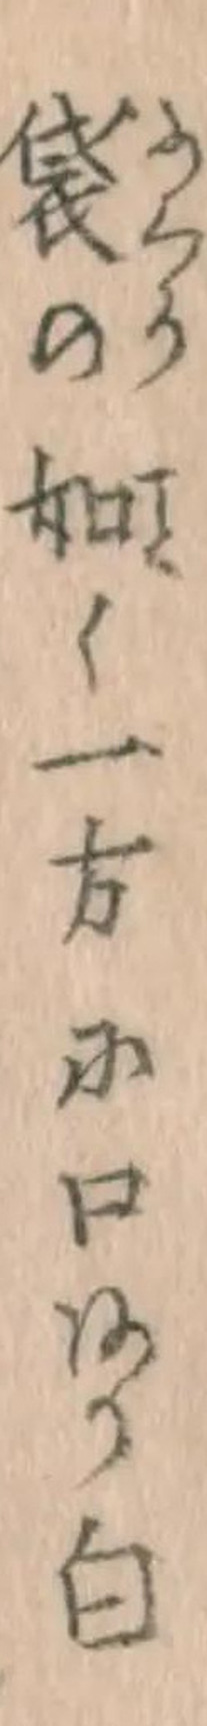袋の如く一方に口あり白
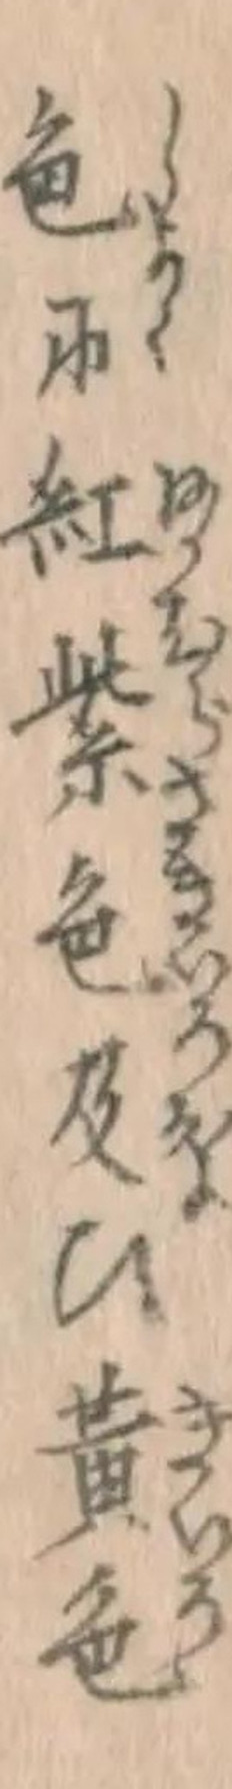色に紅紫色及ひ黄色
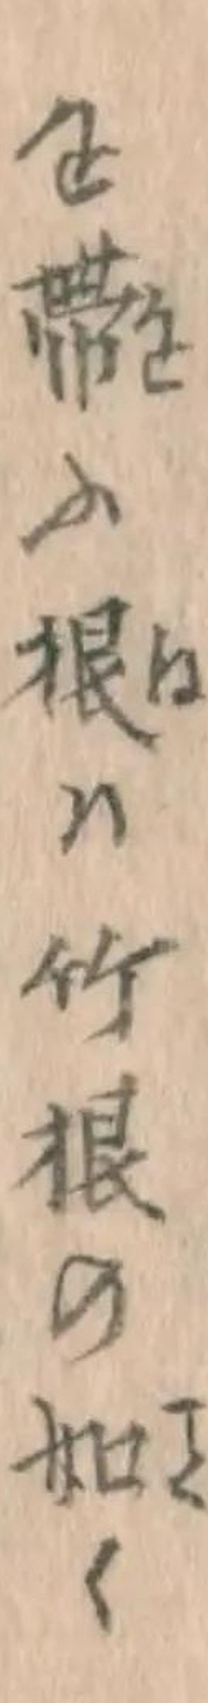を帯ふ根は竹根の如く
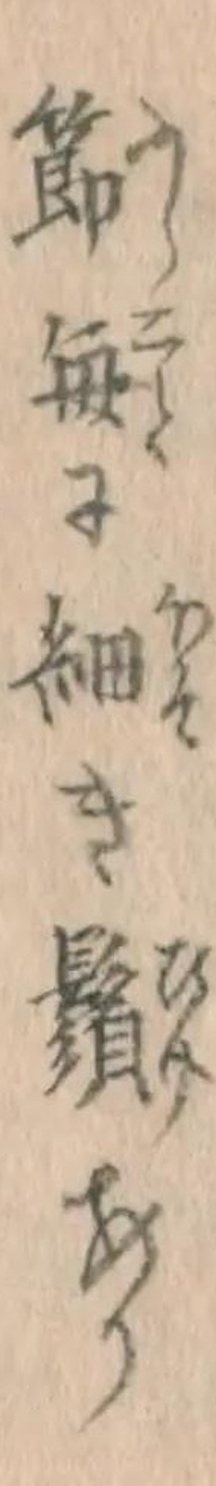節毎に細き鬚あり

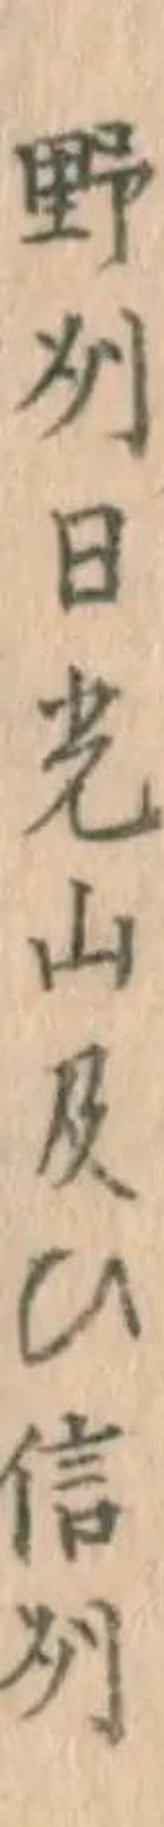野州日光山及ひ信州
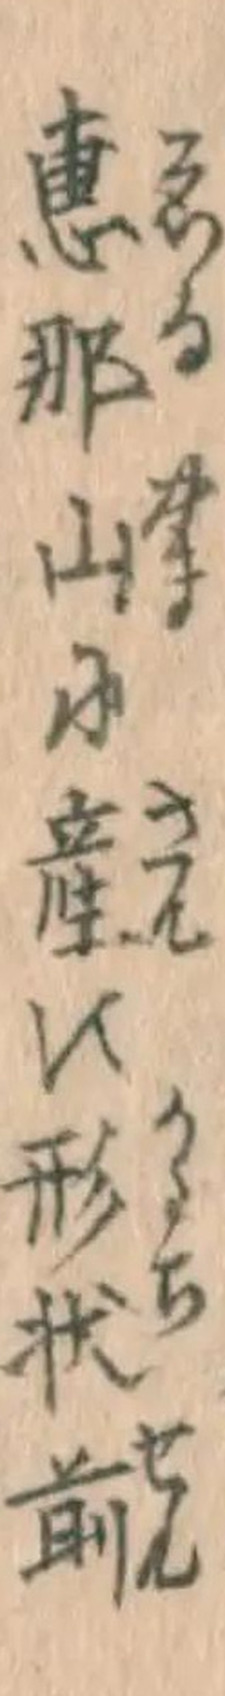恵那山に産す形状前
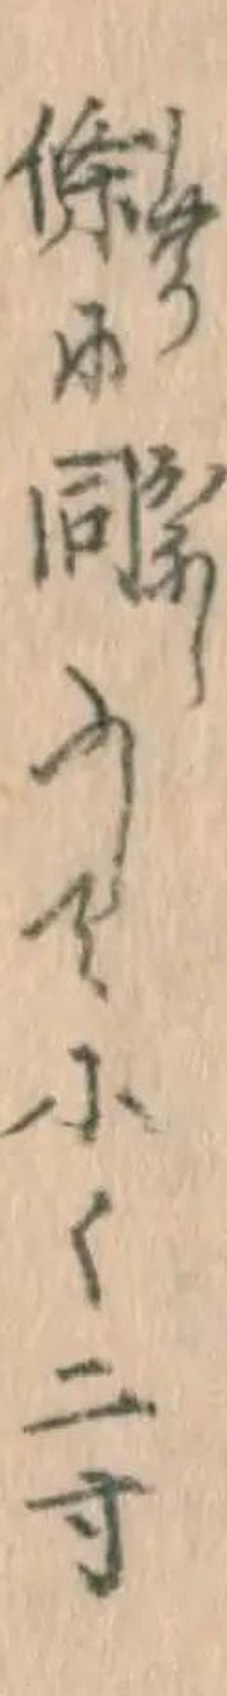条に同にして小く二寸
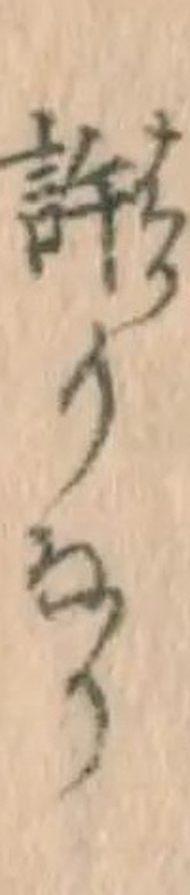許りなり
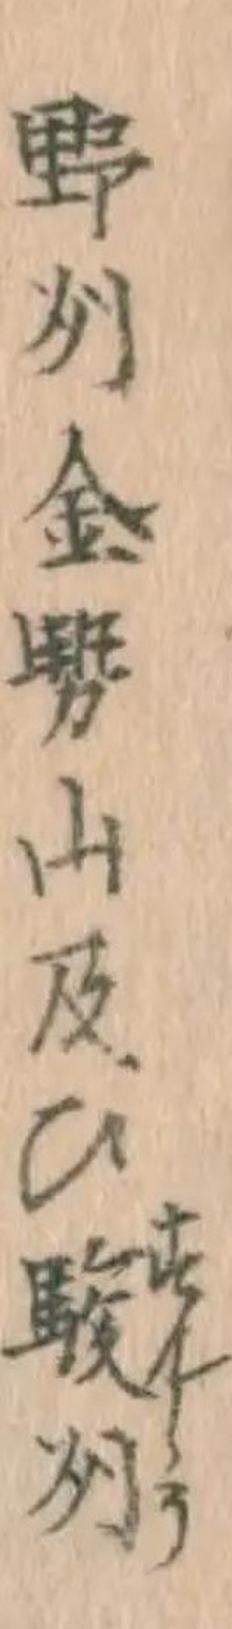野州金勢山及ひ駿州
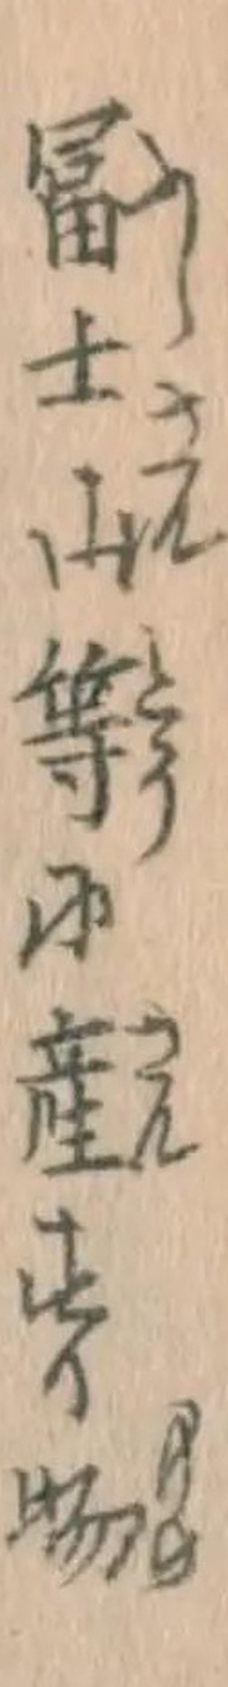富士山等に産する物
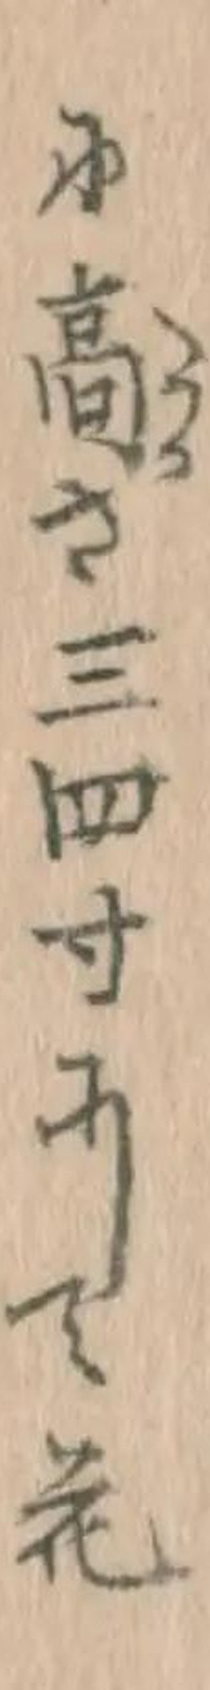に高さ三四寸にして花
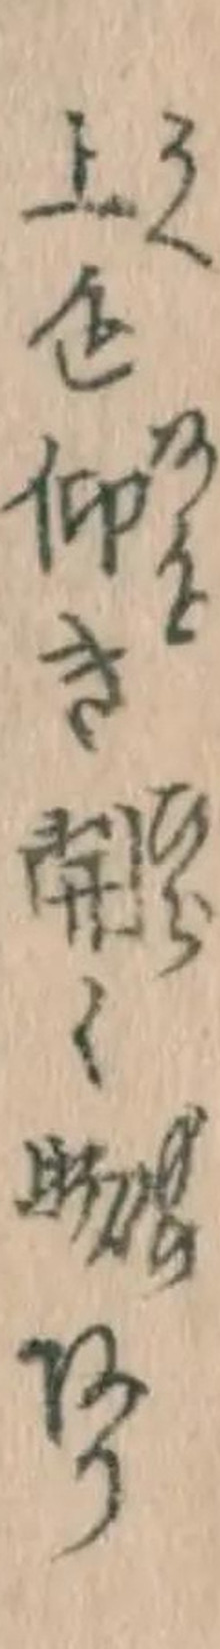上を仰き開く物あり
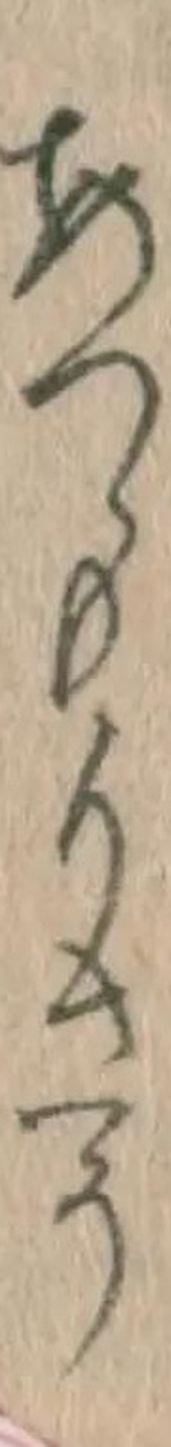あつもりさう
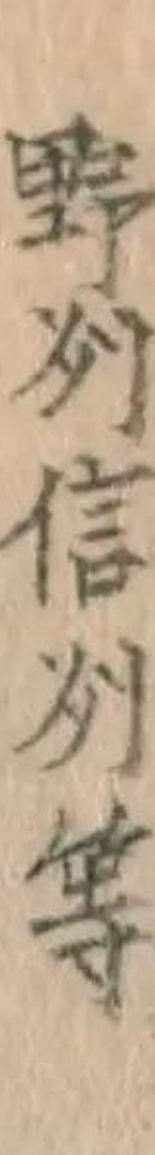野州信州等
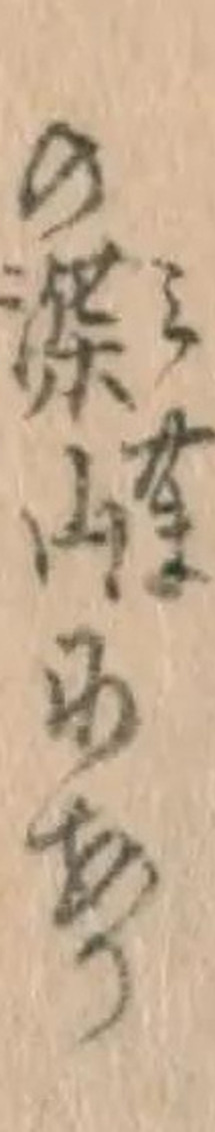の深山にあり
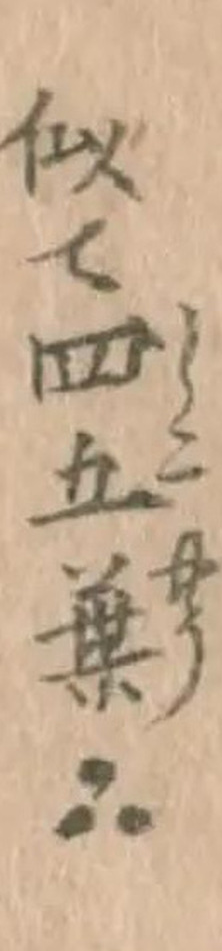似て四五葉∴
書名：本草図譜. 巻37-39
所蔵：国立国会図書館 National Diet Library, JAPAN
